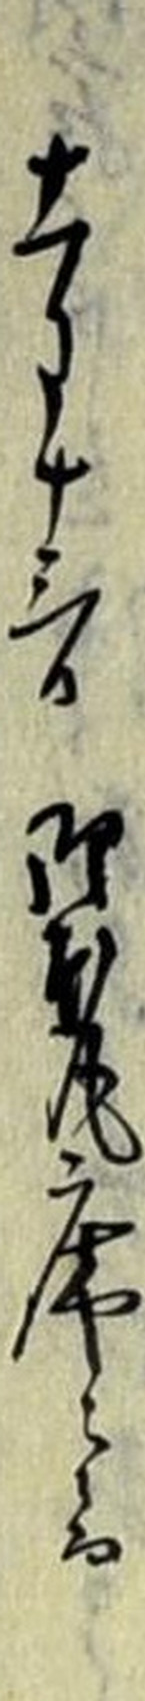十一月十三日御本丸席に而
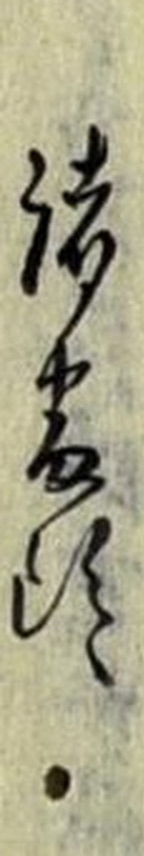諸番頭へ
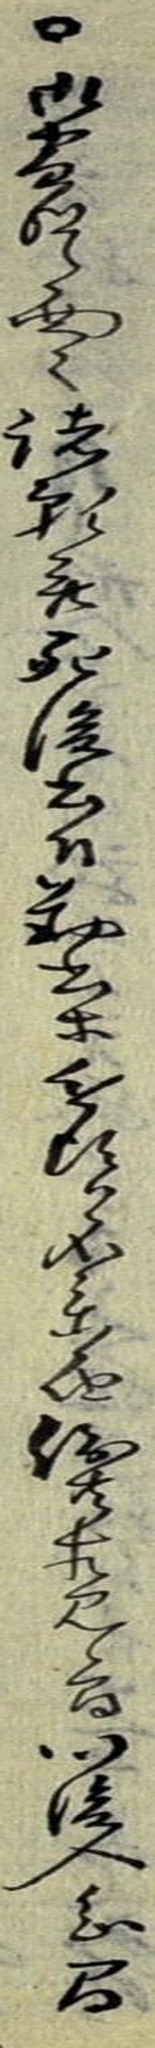〇御番組之面々諸願并死後書付勤書等近頃は不参届儀共相見候間以後入念間
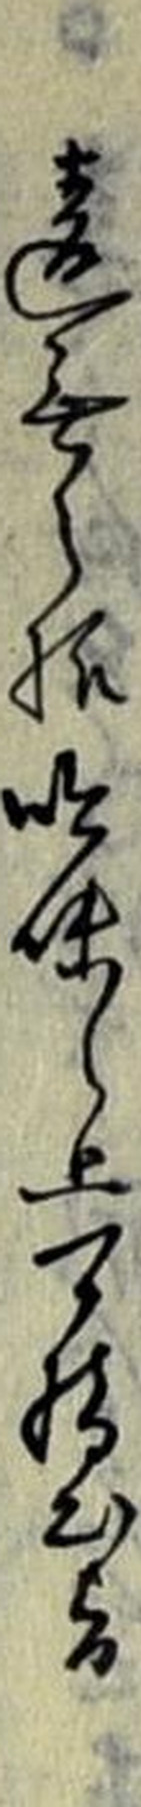違無之様吟味之上可指出旨
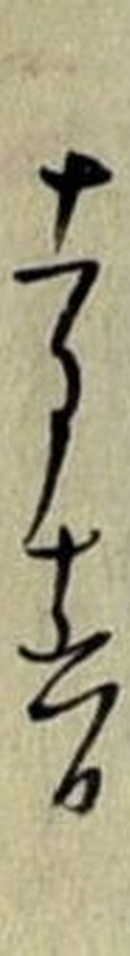十一月十六日
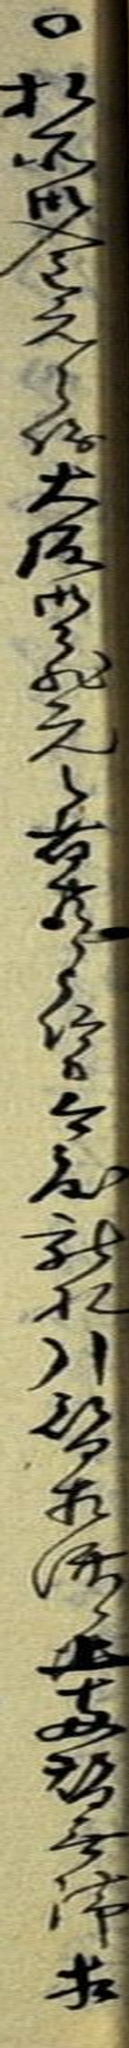〇札所御金元之儀大坂御蔵元之者共へ被仰付今度新札引替相済候上両替無滞相
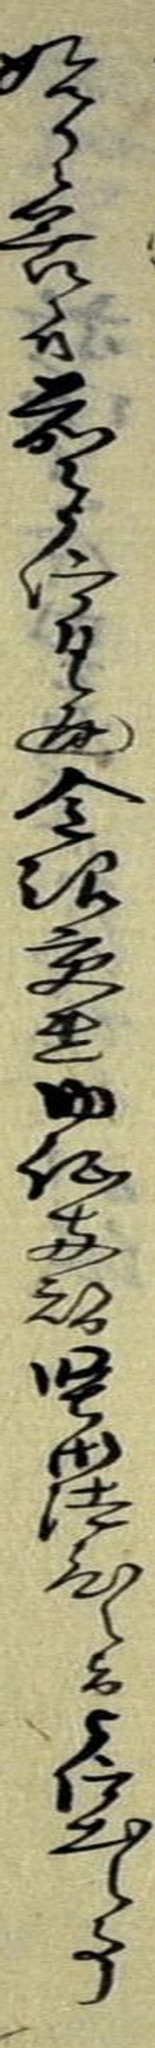始り候筈に付前々被仰付候通金銀交遣内証両替堅御法度之旨被仰出候事
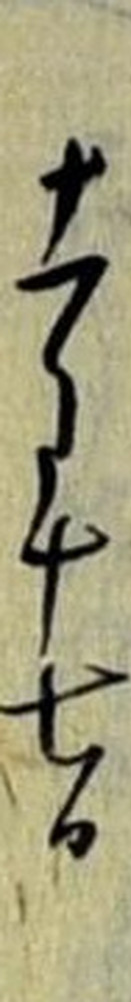十一月十七日
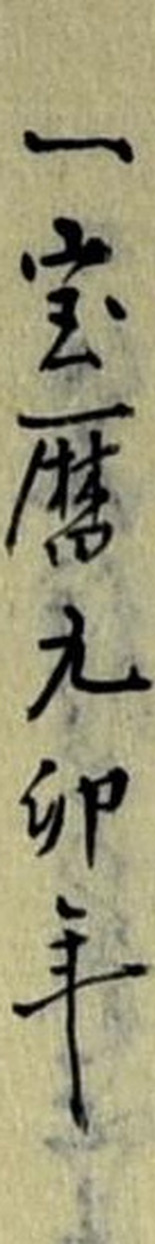一宝暦九卯年
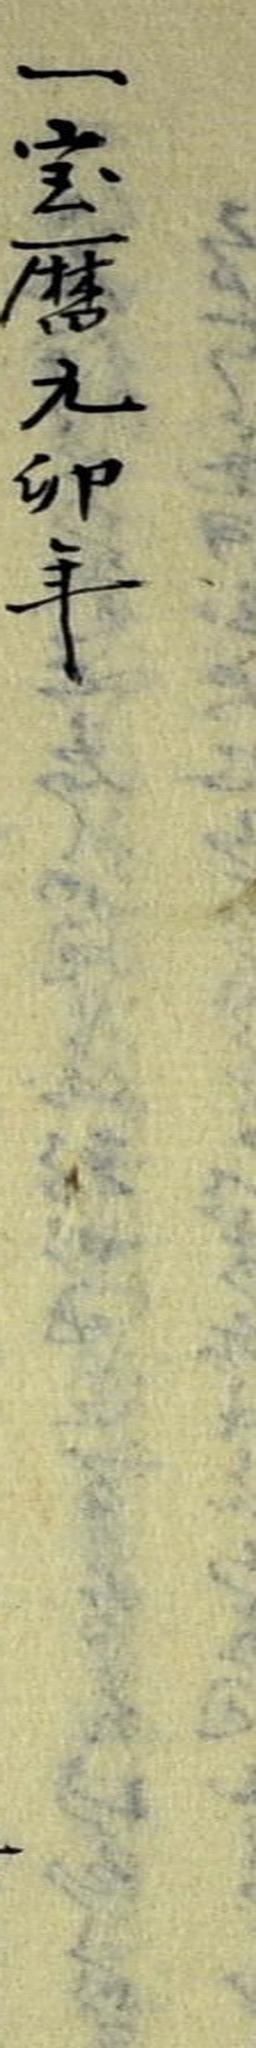一宝暦九卯年
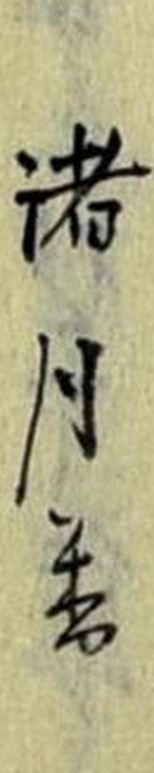諸月番
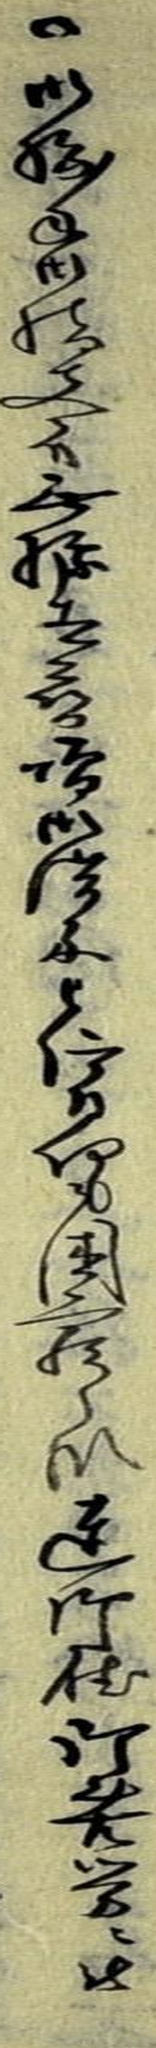〇御勝手御指支に付無拠去暮増御借米被仰付何も困窮之段達御聴御苦労に被
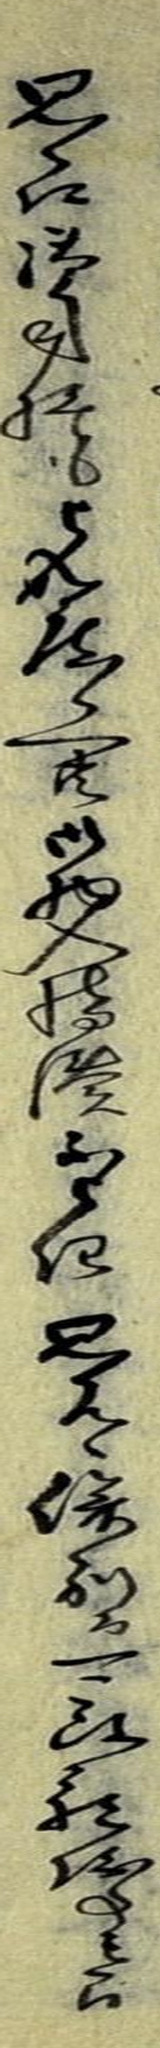思召御用捨も被成度候へ共御物入指湊不被任思召候併別而可致難儀事に候間
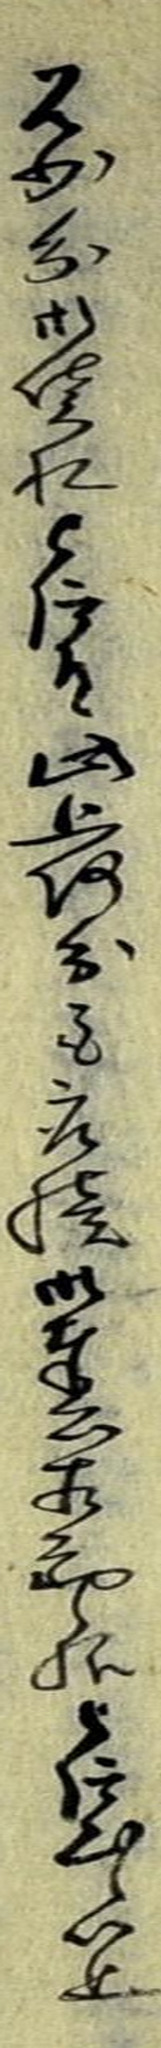乍少分御貸札被仰付候此上何分にも取続御奉公相勤候様被仰出候以上
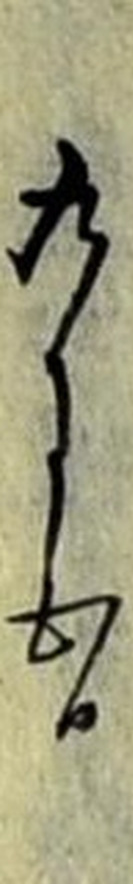九月五日
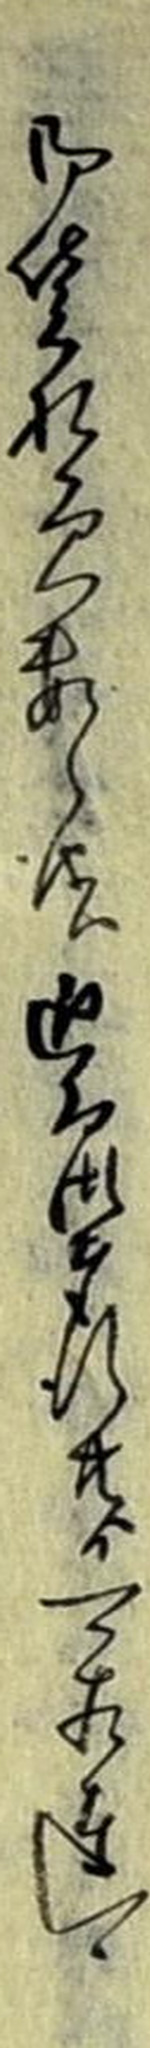御貸札員数之儀は追而御奉行共ゟ可相達候
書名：命令之部 二
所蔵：福井県文書館 Fukui Prefectural Archives
